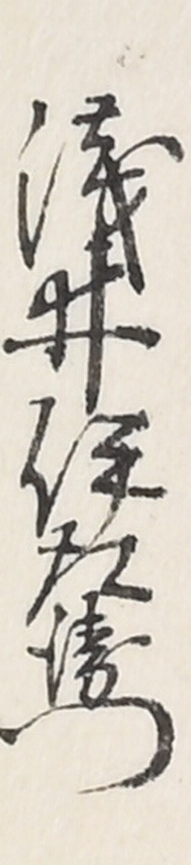浅井伊左衛門
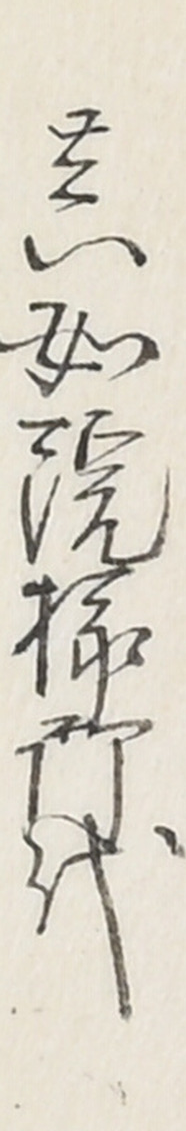真如院様御代
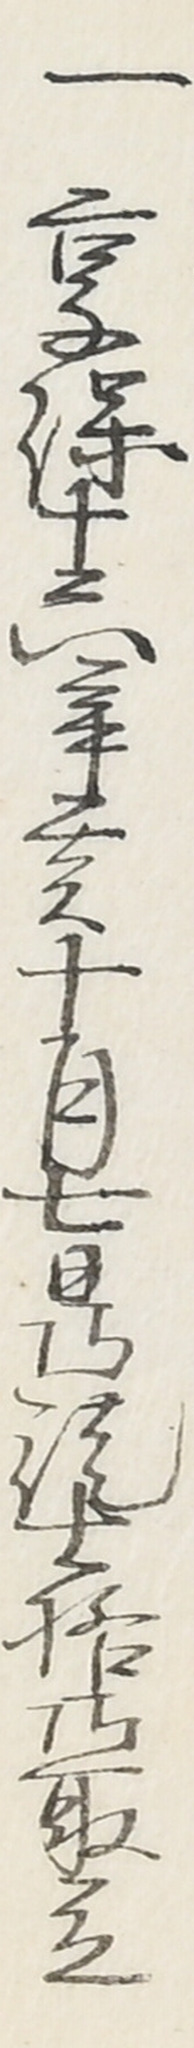一享保十六年辛亥十月七日御徒士格御取立
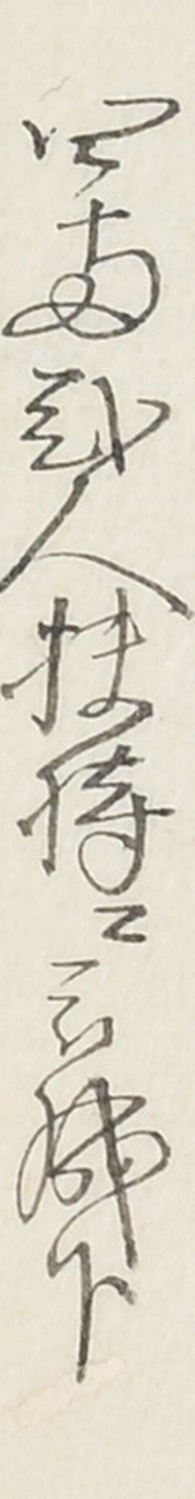四両弐人扶持ニ被成下
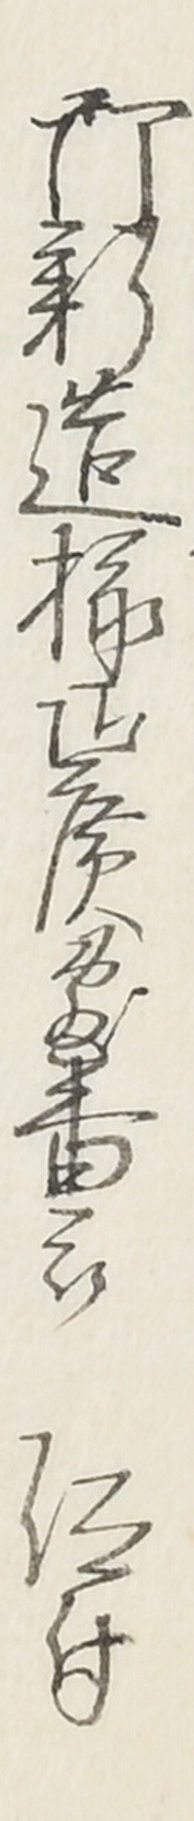御新造様御広敷番被仰付
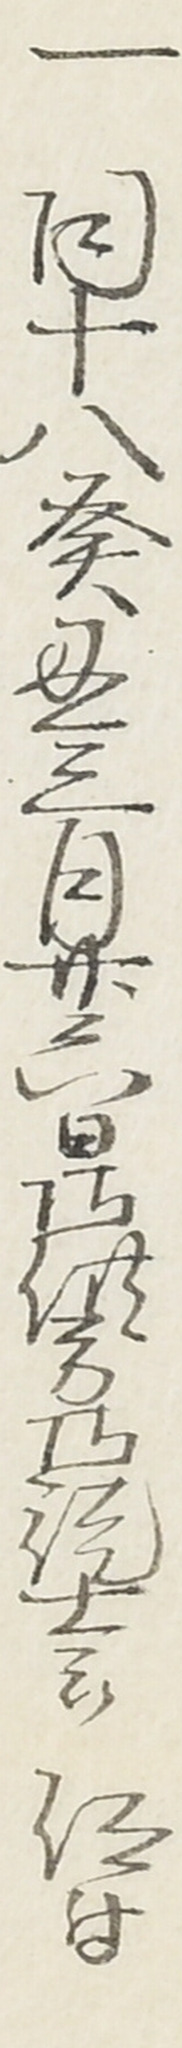一同十八癸丑三月廿六日御供方徒士被仰付
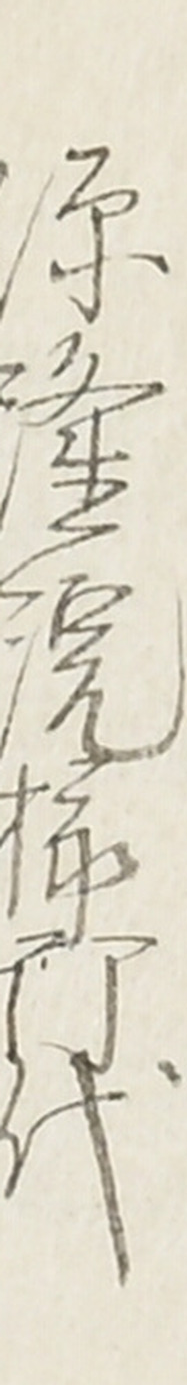源隆院様御代
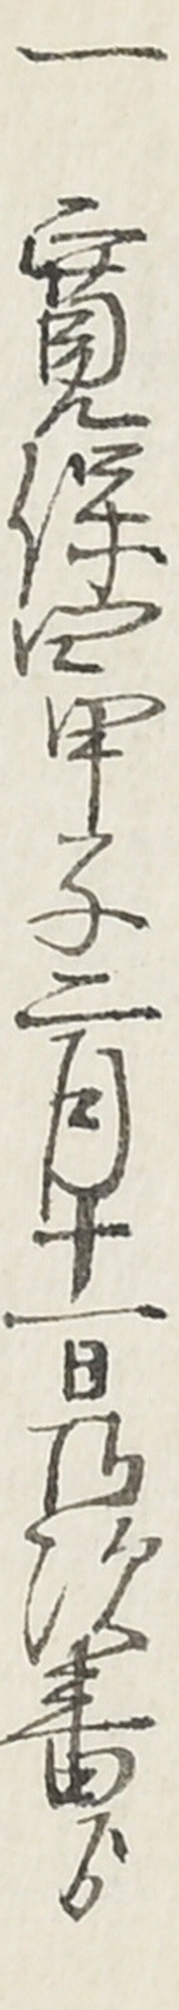一寛保四甲子二月十一日御次番ゟ
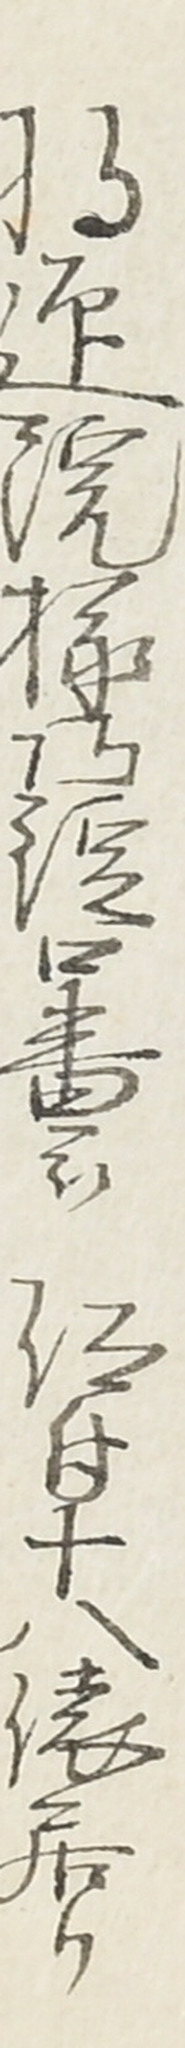将迎院様御錠口番被仰付十八俵居り
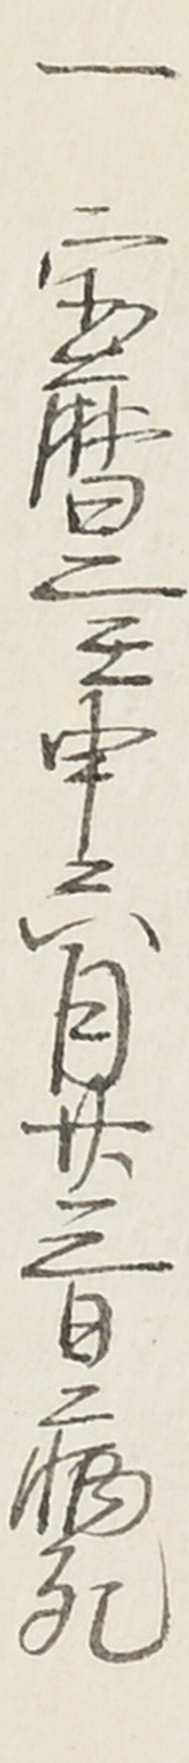一宝暦ニ壬申六月廿三日病死
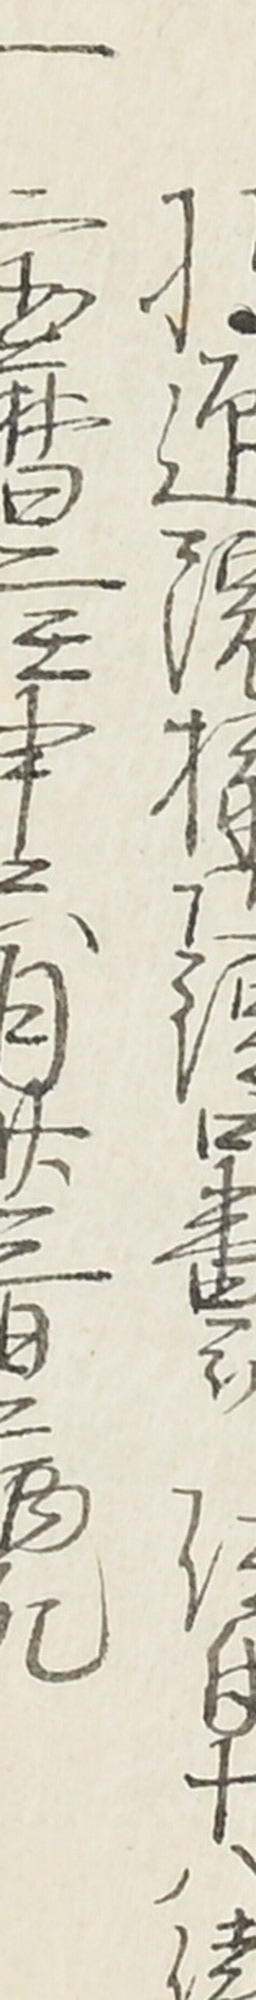一宝暦ニ壬申六月廿三日病死
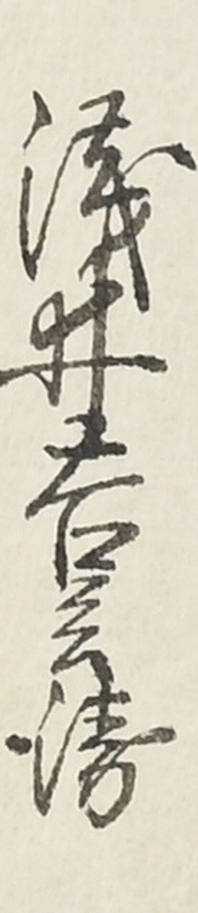浅井吉兵衛
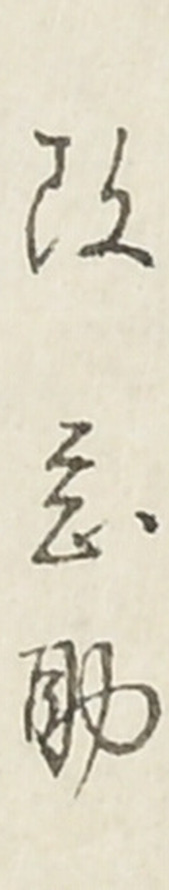改甚助
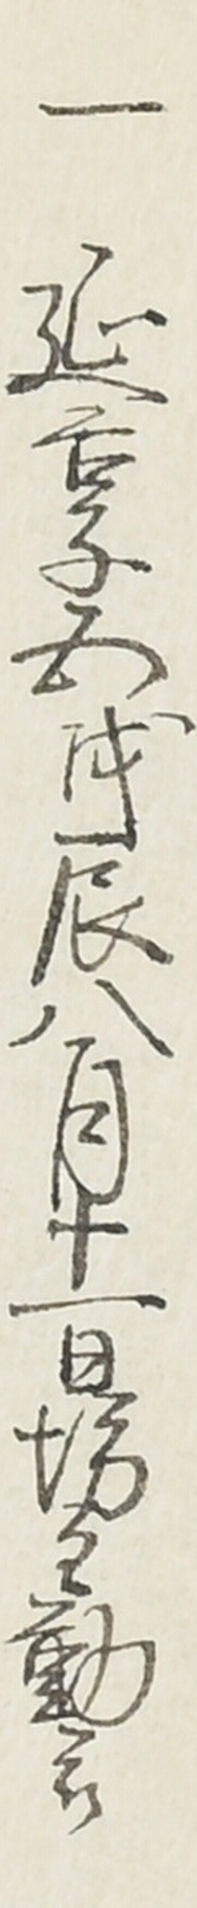一延享五戊辰八月十一日坊主勤被
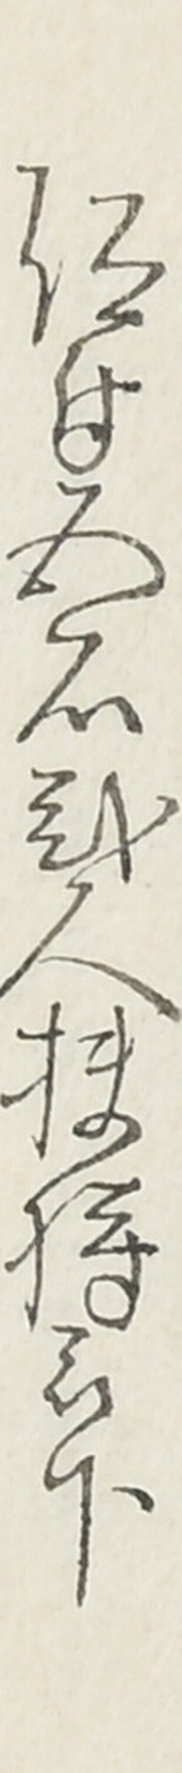仰付五石弐人扶持被下
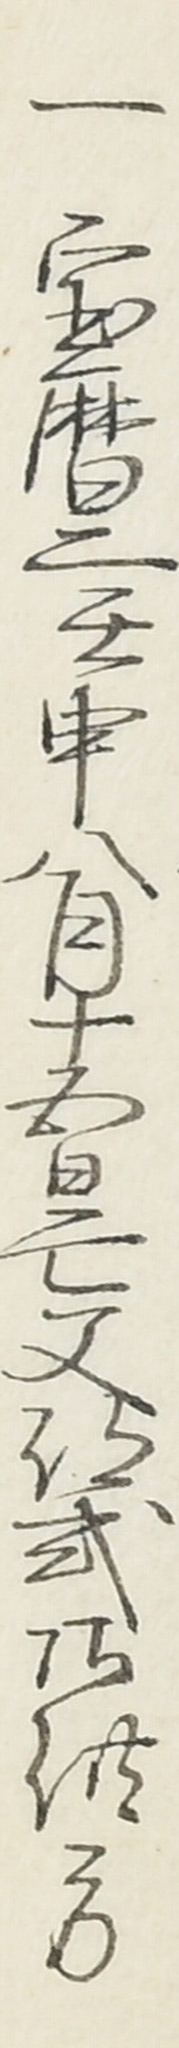一宝暦二壬申八月十五日亡父跡式御供方
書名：無足諸士勤仕録（四）
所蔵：伊那市立高遠町図書館・合同会社AMANE
